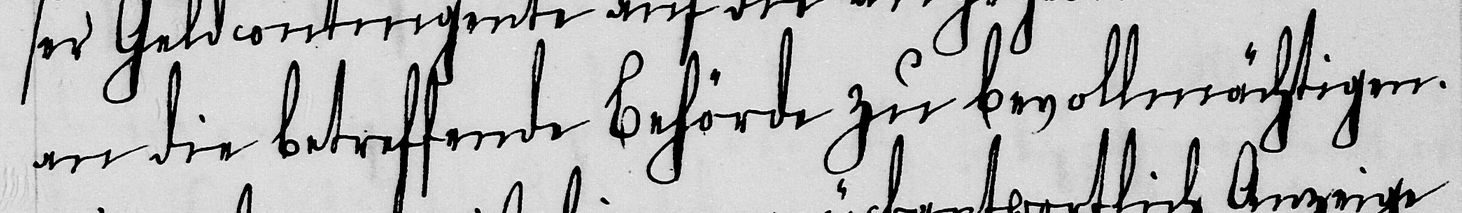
an die betreffende Behörde zu bevollmächtigen.
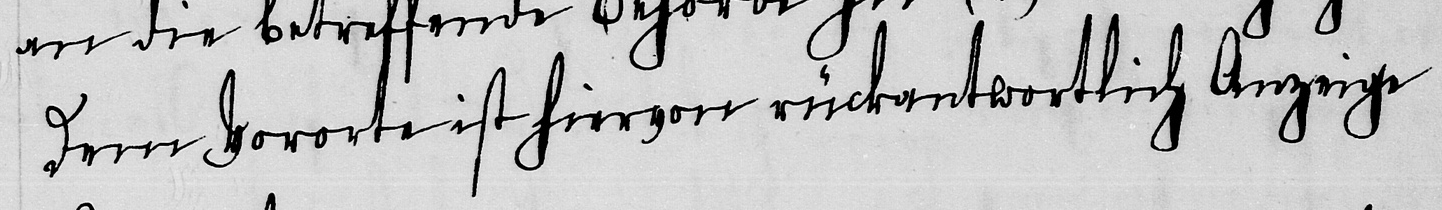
Dem Vororte ist hiervon rückantwortlich Anzeige
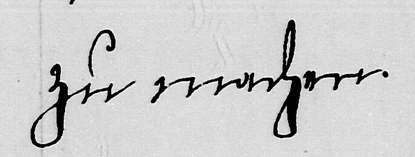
zu machen.
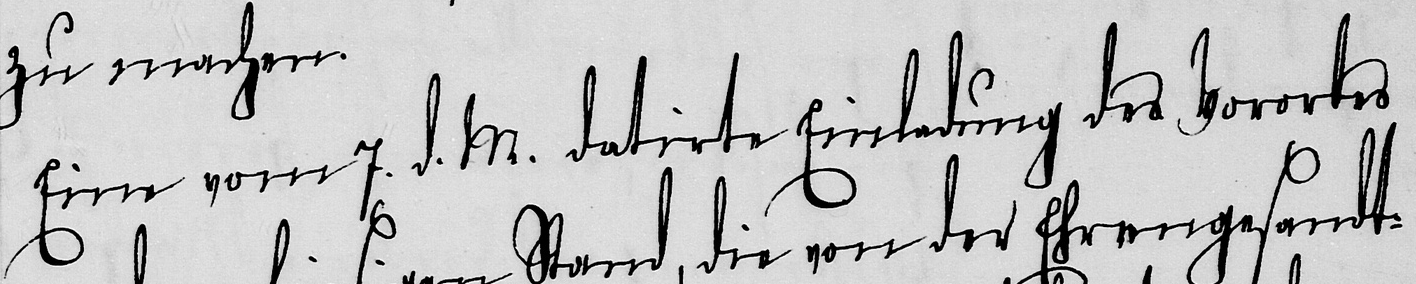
Eine vom 7. d. M. datirte Einladung des Vorortes
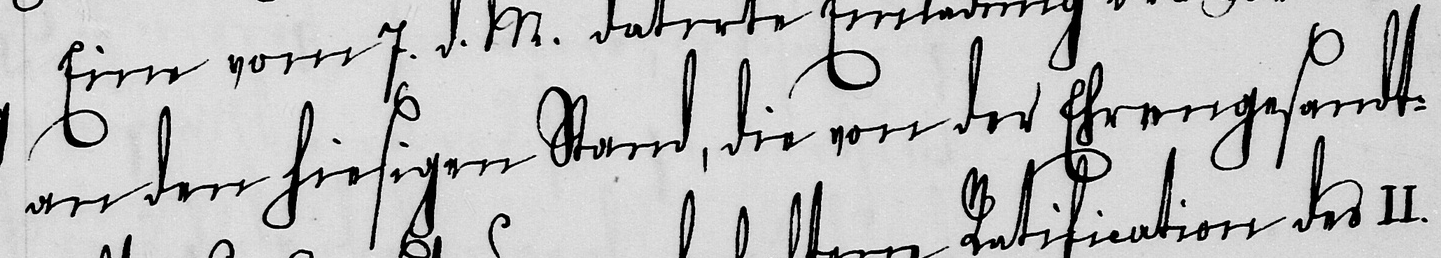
an den hiesigen Stand, die von der Ehrengesandt¬
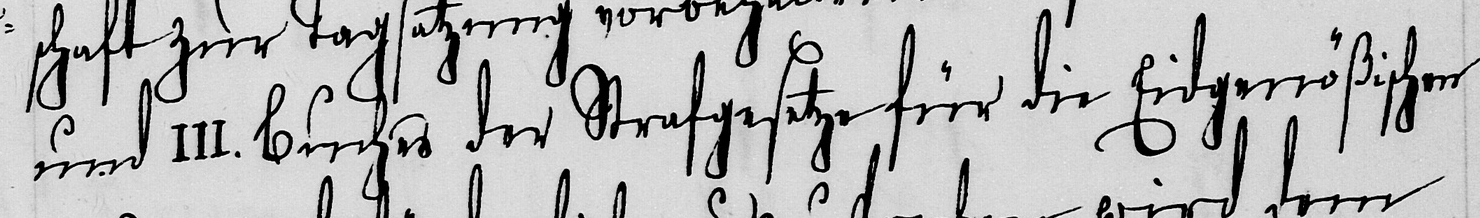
und III. Buches der Strafgesetze für die Eidgenößischen
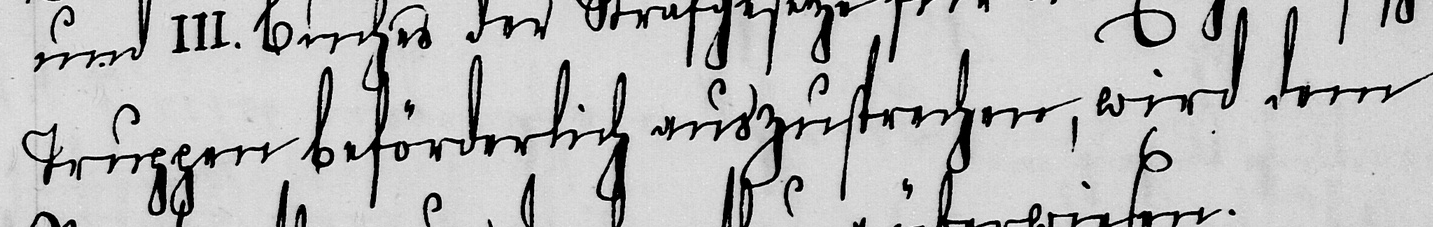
Truppen beförderlich auszusprechen, wird dem
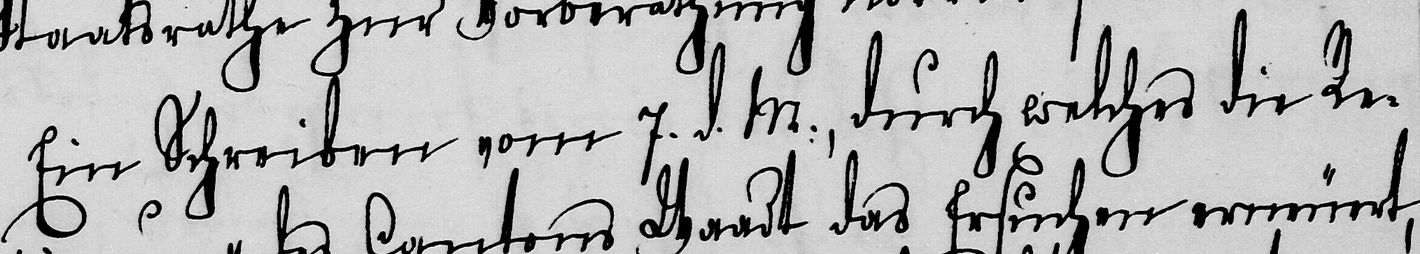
Ein Schreiben vom 7. d. M., durch welches die Re¬
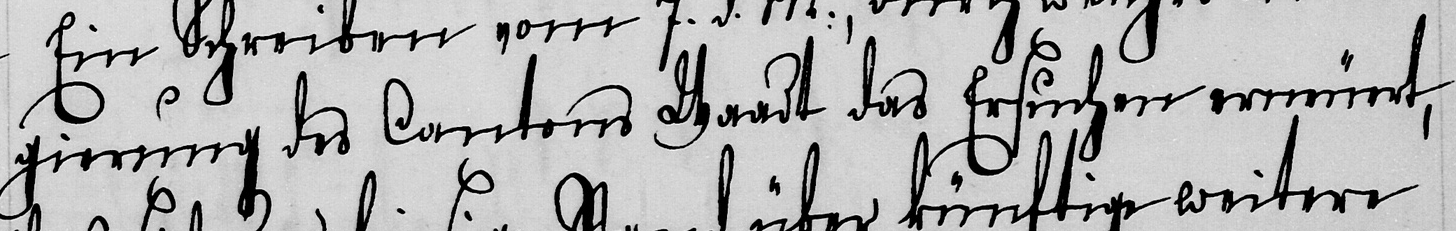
gierung des Cantons Waadt das Ersuchen erneuert,
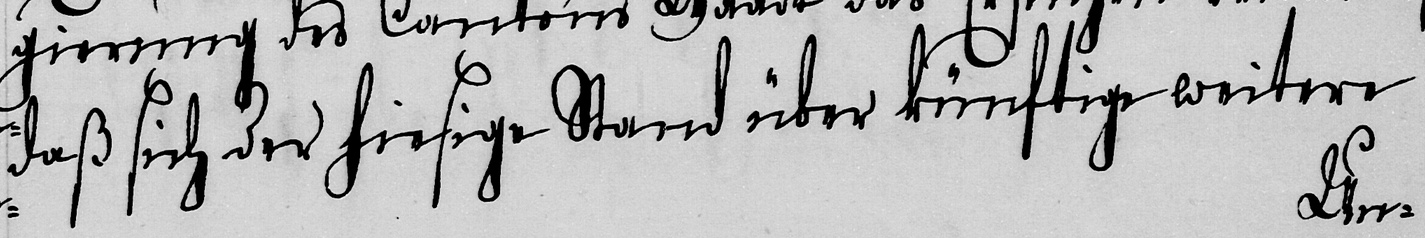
daß sich der hiesige Stand über künftige weitere
